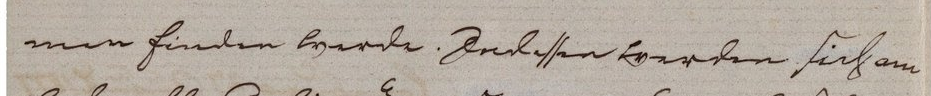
men finden werde. Indessen werden sich am
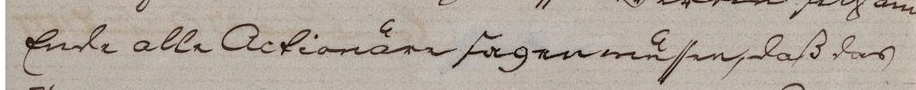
Ende alle Actionäre sagen müssen, daß das
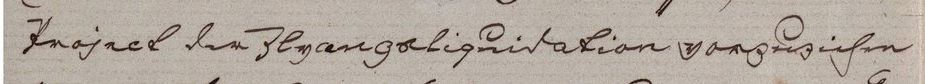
Project der Zwangsliquidation vorzuziehen
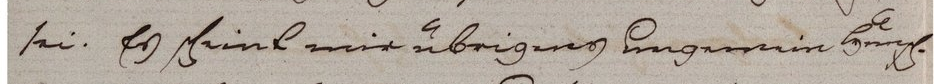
sei. Es scheint mir übrigens ungemein wünsch-
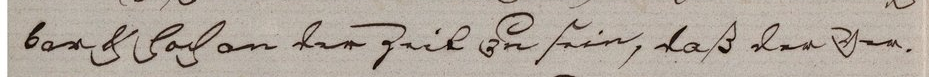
bar & hoch an der Zeit zu sein, daß der Ver-
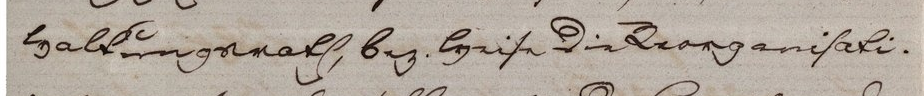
waltungsrath, bez.weise die Reorganisati-
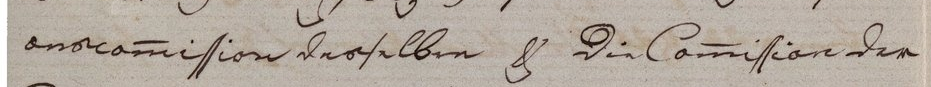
onscommission desselben & die Commission der
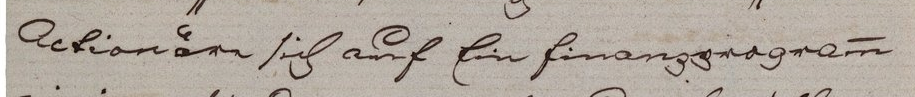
Actionäre sich auf ein Finanzprogramm
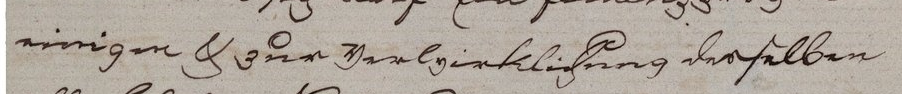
einigen & zur Verwirklichung desselben
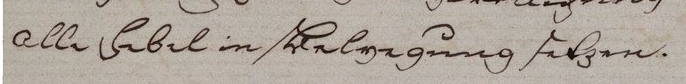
alle Hebel in Bewegung setzen.
